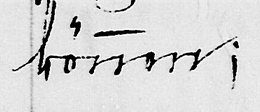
können;
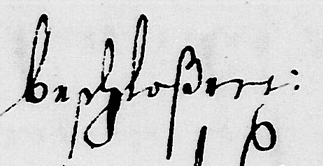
beschloßen:
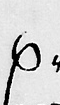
1.)
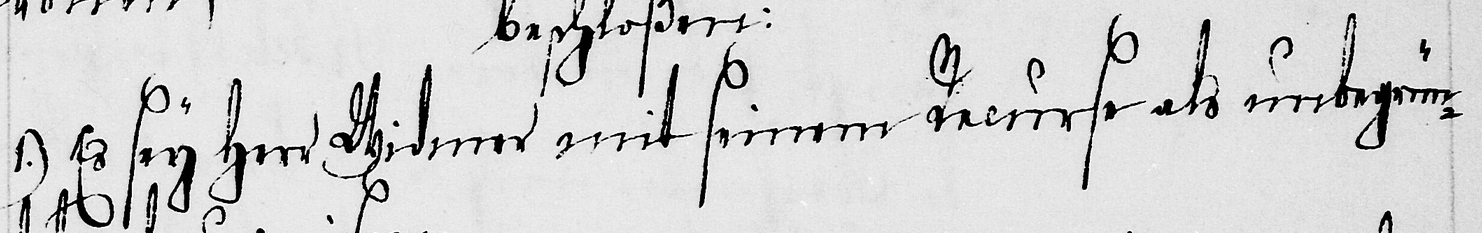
Es sey Herr Widmer mit seinem Recurse als unbegrün¬
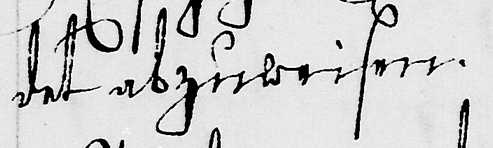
det abzuweisen.
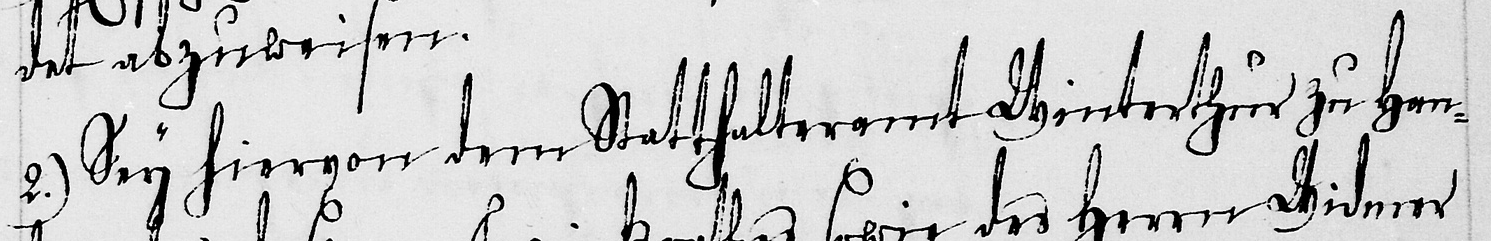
2.) Sey hiervon dem Statthalteramt Winterthur zu Han¬
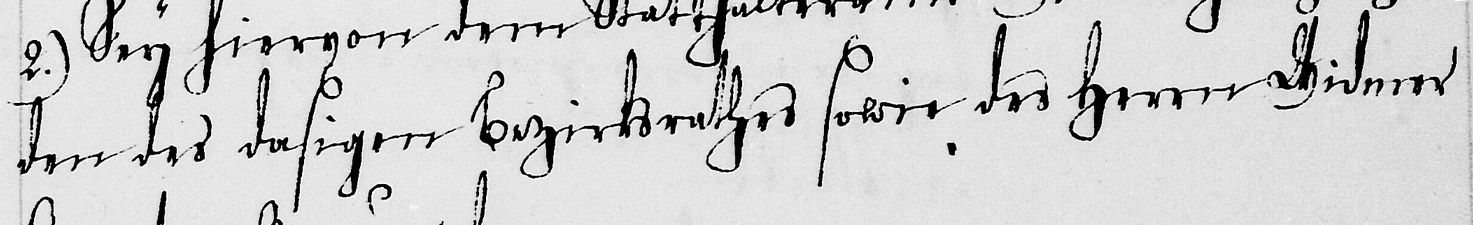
den des dasigen Bezirksrathes sowie des Herrn Widmer
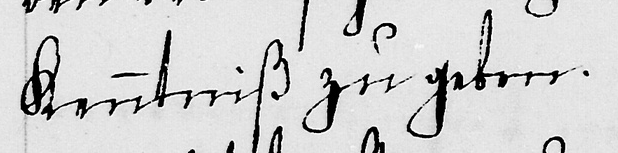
Kenntniß zu geben.
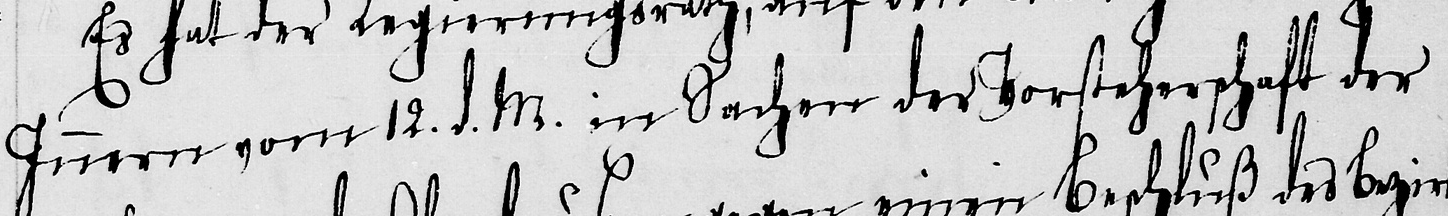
Innern vom 12. d. M. in Sachen der Vorsteherschaft der
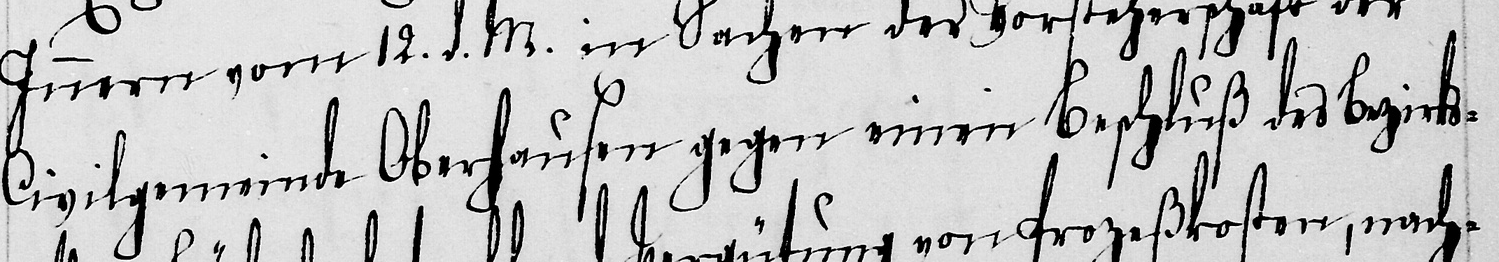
Civilgemeinde Oberhausen gegen einen Beschluß des Bezirk¬
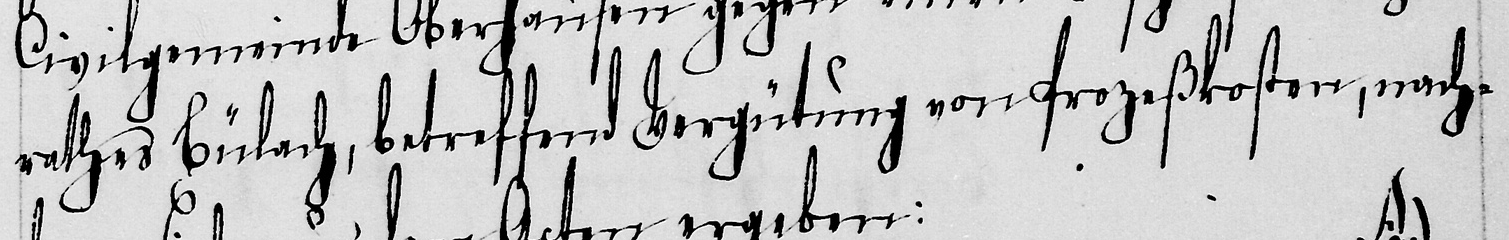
rathes Bülach, betreffend Vergütung von Prozeßkosten, nach¬
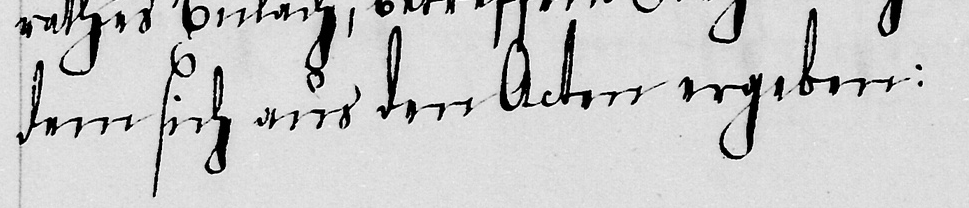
dem sich aus den Acten ergeben:
